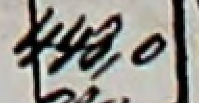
443,0
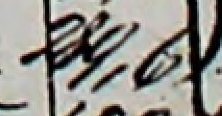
289,6
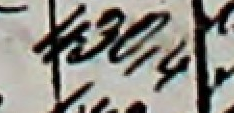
430,4
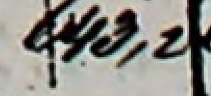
643,2
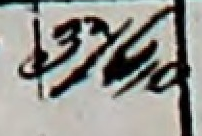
376,0
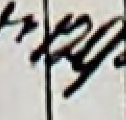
129
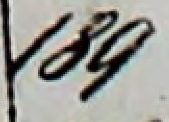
189
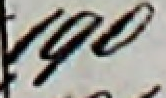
190
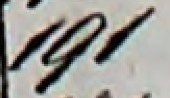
191
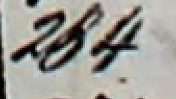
284
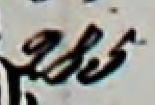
285
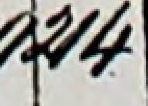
214
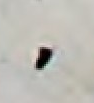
„
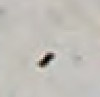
„
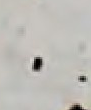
„
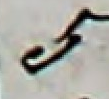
5
